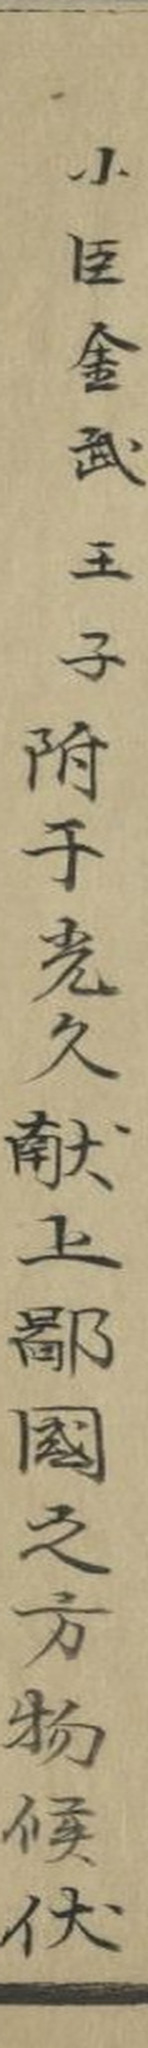小臣金武王子附于光久献上鄙国之方物候伏
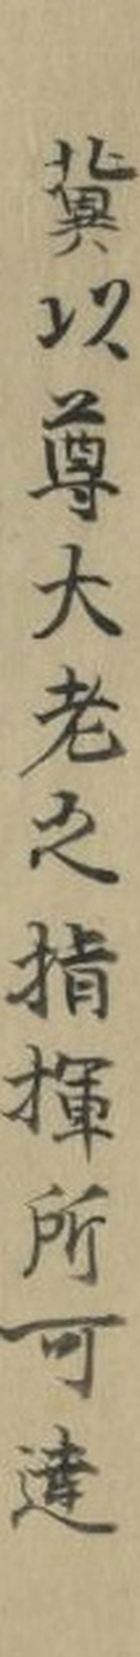冀以尊大老之指揮所可達
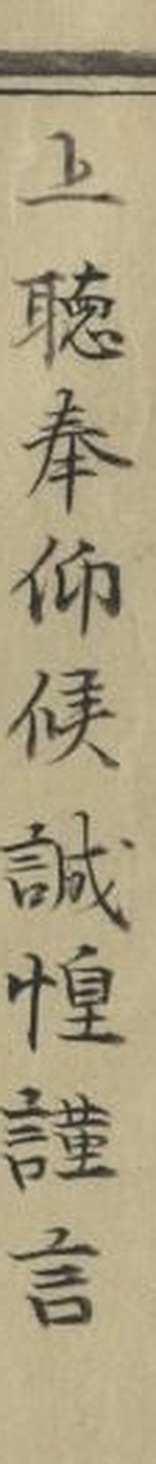上聴奉抑候誠惶謹言
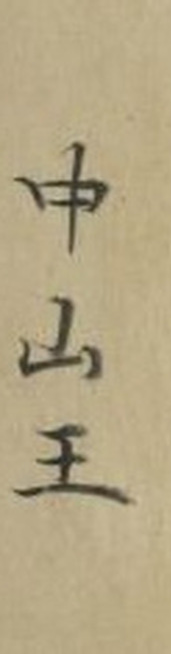中山王

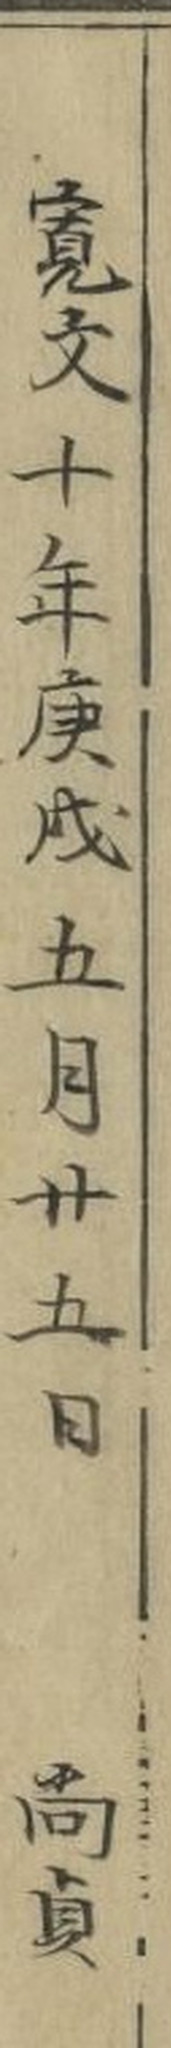寛文十年庚戌五月廿五日尚貞
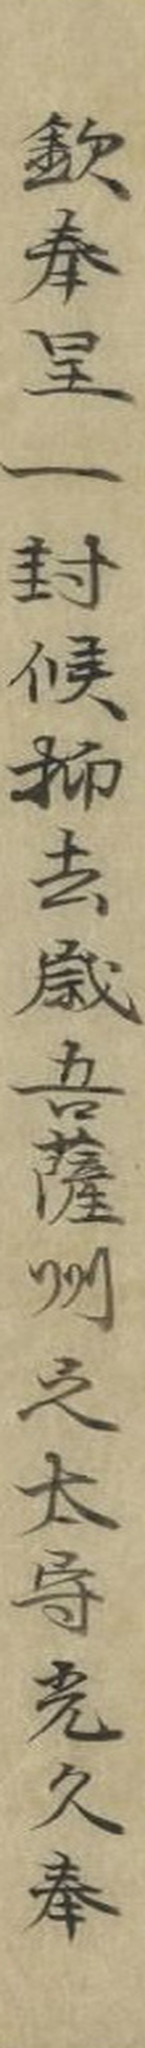欽奉呈一封候抑去歳吾薩州之太守光久奉
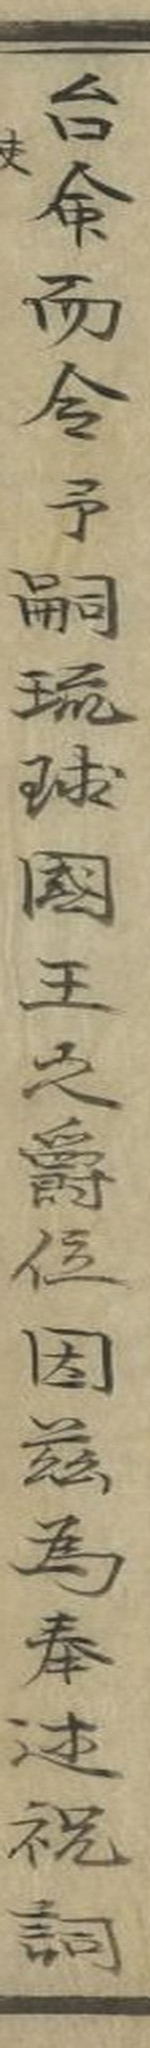台命而令予嗣琉球国王之爵位因茲為奉述祝詞
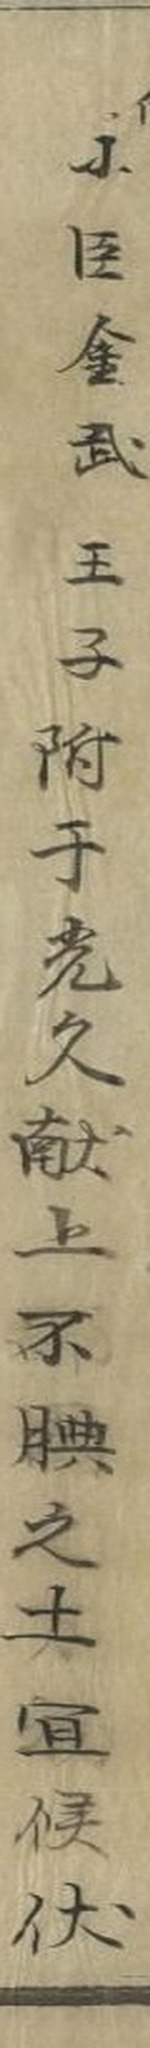使小臣金武王子附于光久献上不腆之土冝候伏
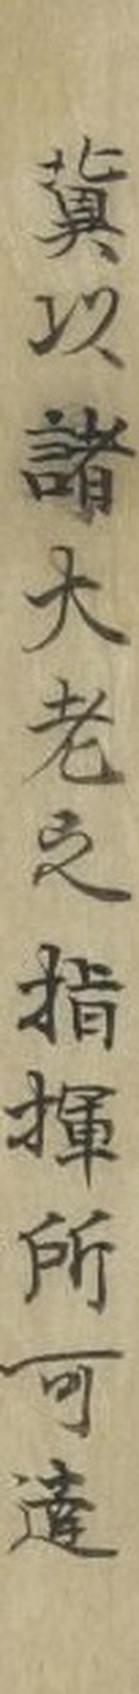冀以諸大名之指揮所可達
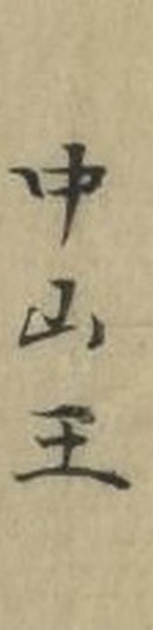中山王
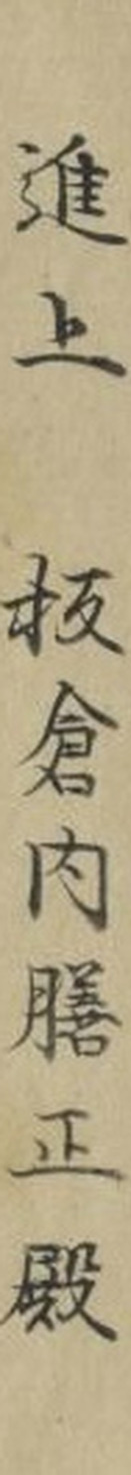進上板倉内膳正殿
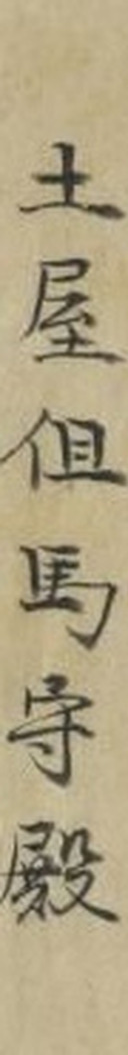土屋但馬守殿
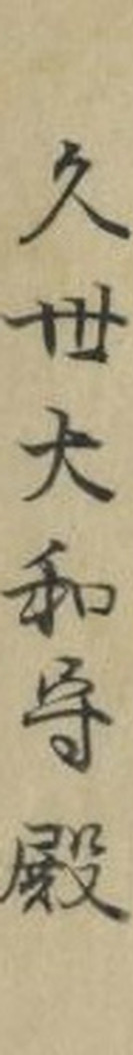久世大和守殿
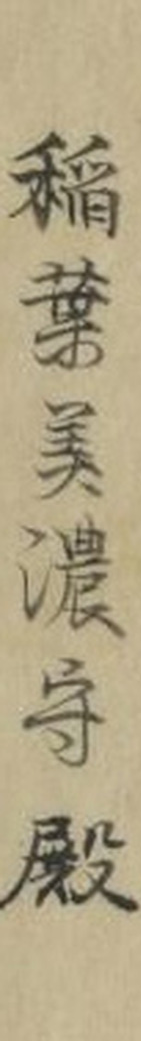稲葉美濃守殿
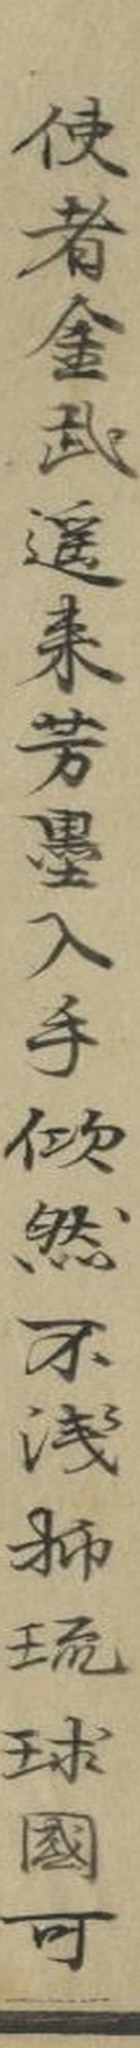使者金武遥来芳墨入手傾然不残抑琉球国可
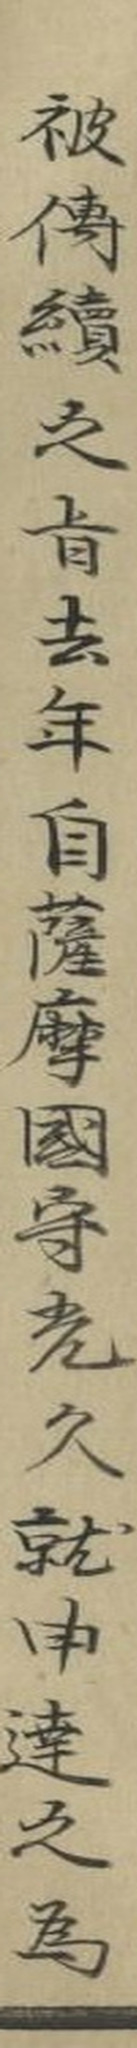被伝続之旨去年自薩摩国守光久就申達之為
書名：琉球往来（下）
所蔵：University of the Ryukyus Library
